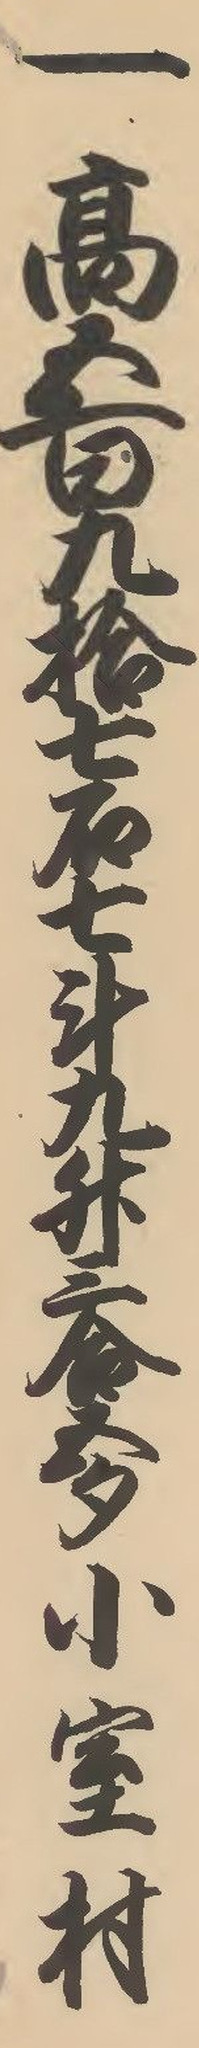一髙五百九拾七石七斗九升三合五夕小室村

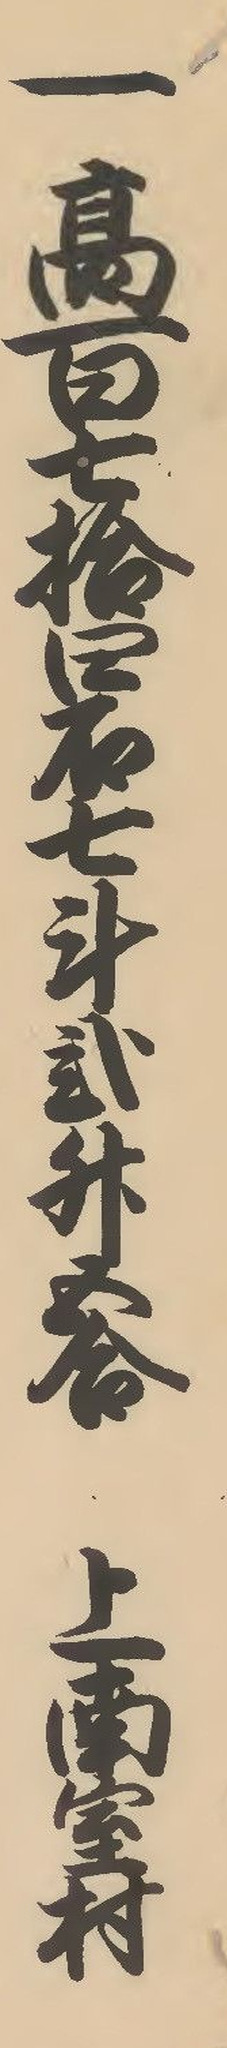一髙百七拾四石七斗弐升五合上南室村
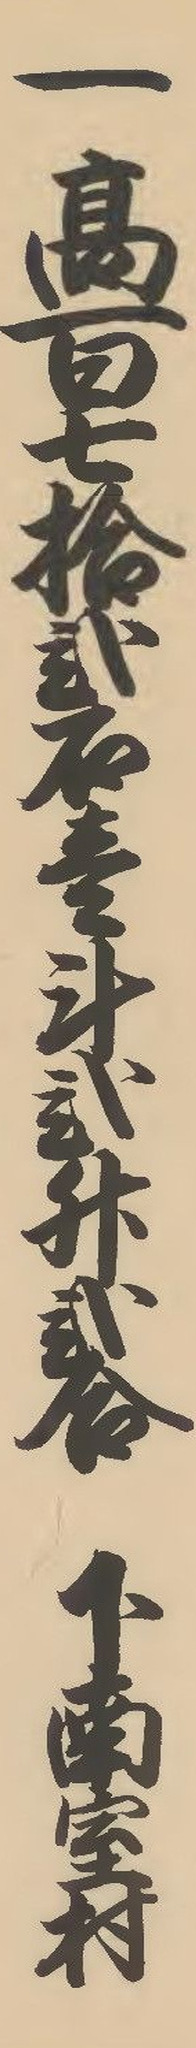一髙百七拾弐石壱斗弐升弐合下南室村
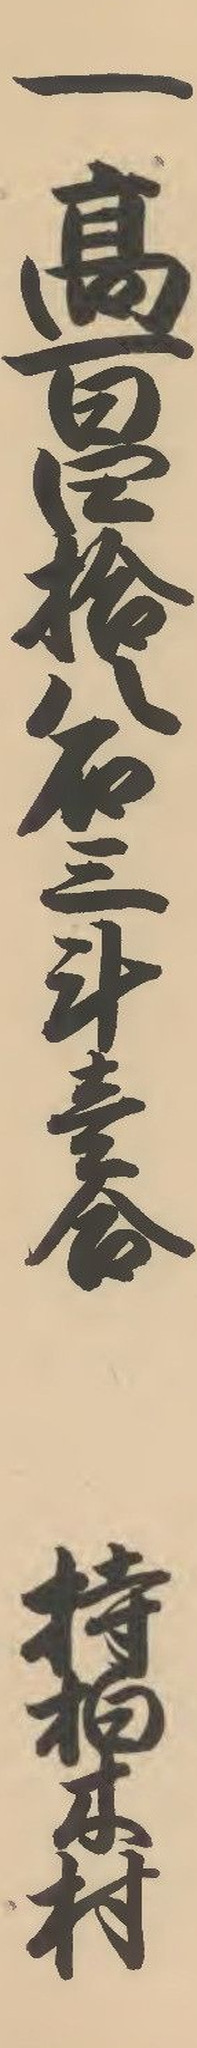一髙百四拾八石三斗壱合持柏木村
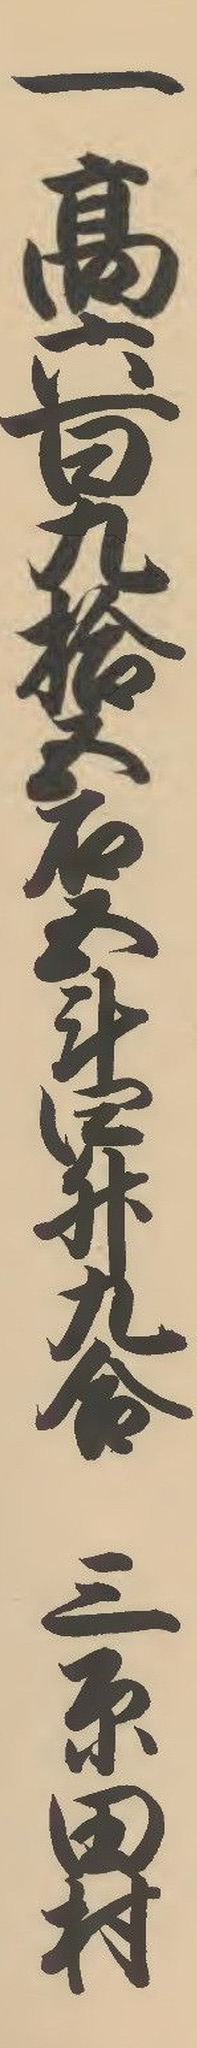一髙六百九拾五石五斗四升九合三原田村
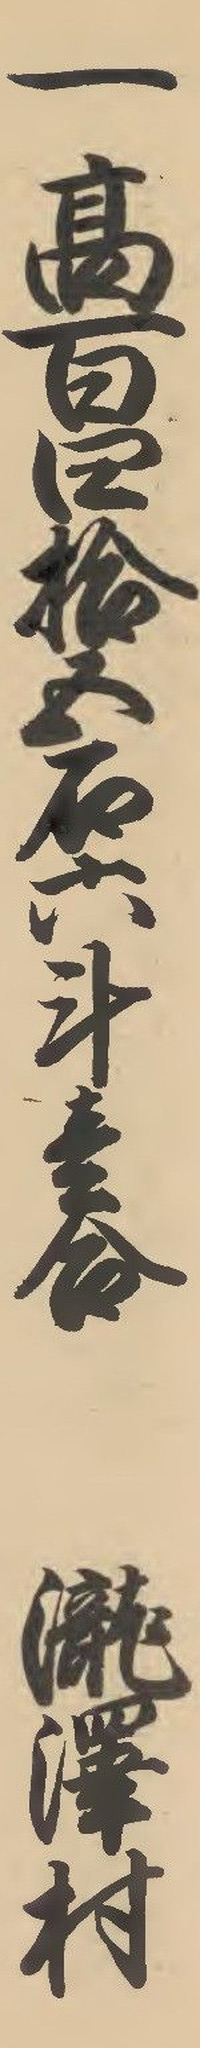一髙百四拾五石六斗壱合瀧澤村
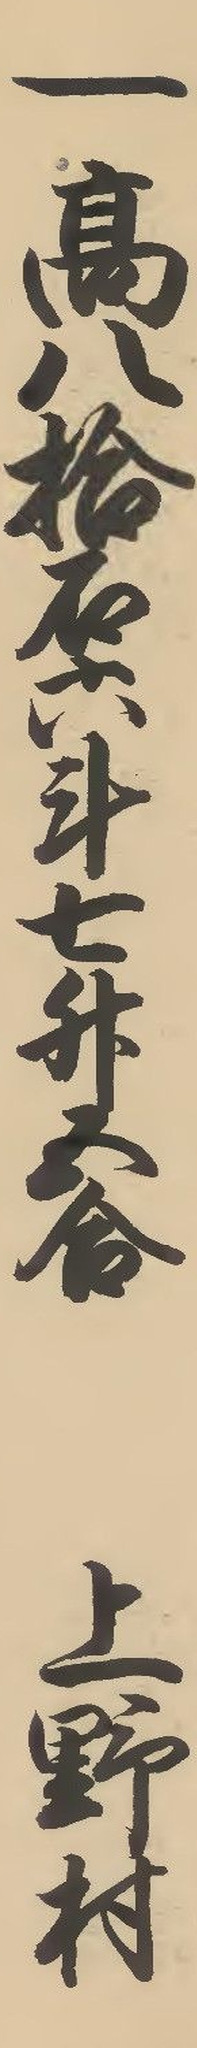一髙八拾石六斗七升五合上野村
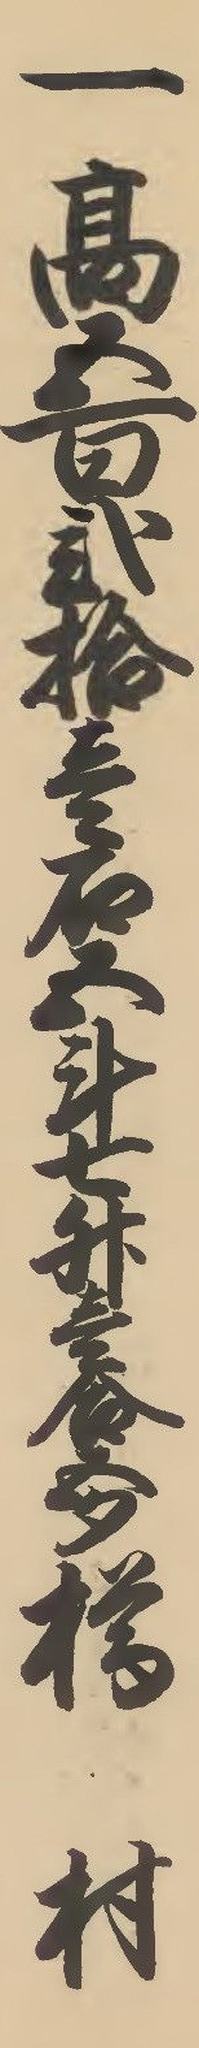一髙五百弐拾壱石五斗七升壱合五夕樽村
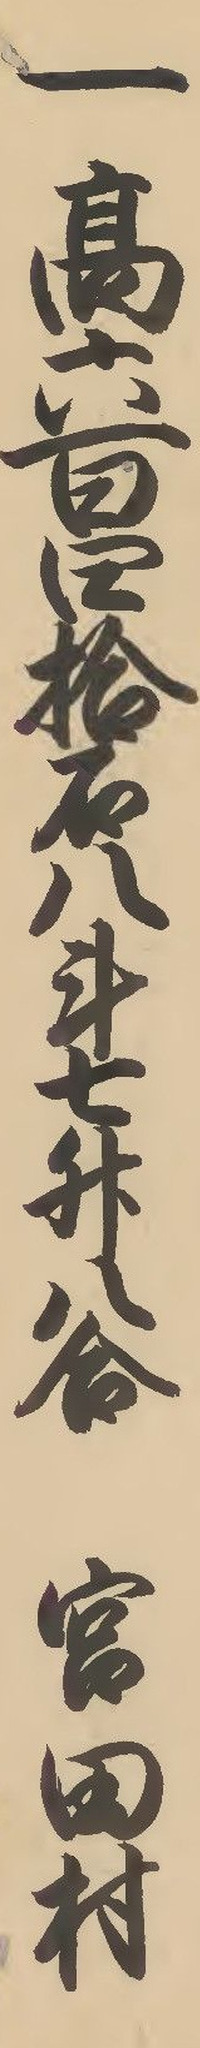一髙六百四拾石八斗七升八合宮田村

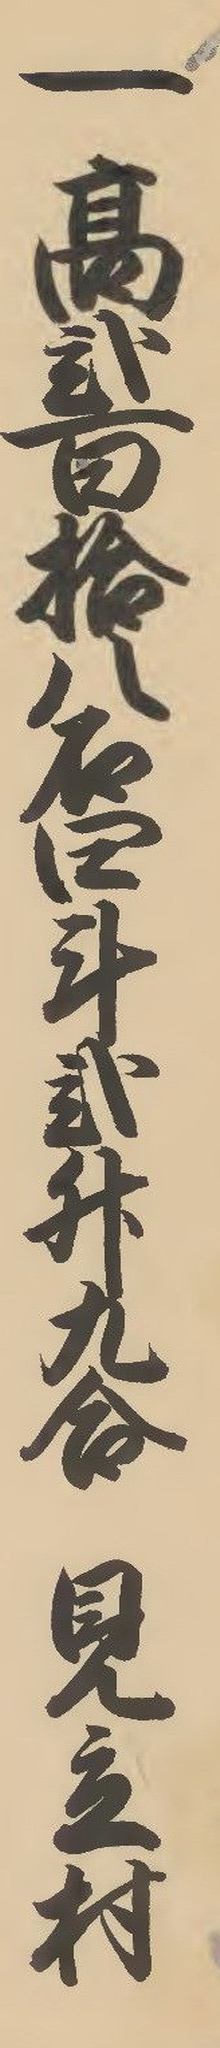一髙弐百拾八石四斗弐升九合見立村
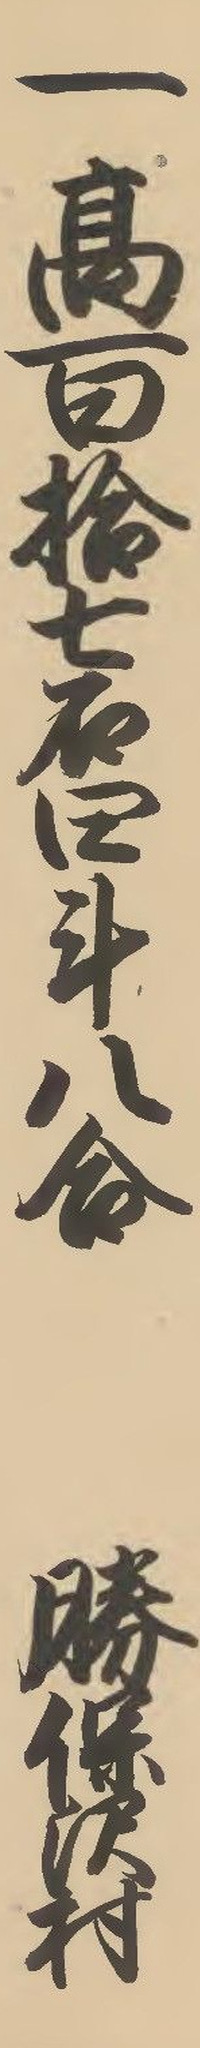一髙百拾七石四斗八合勝保沢村
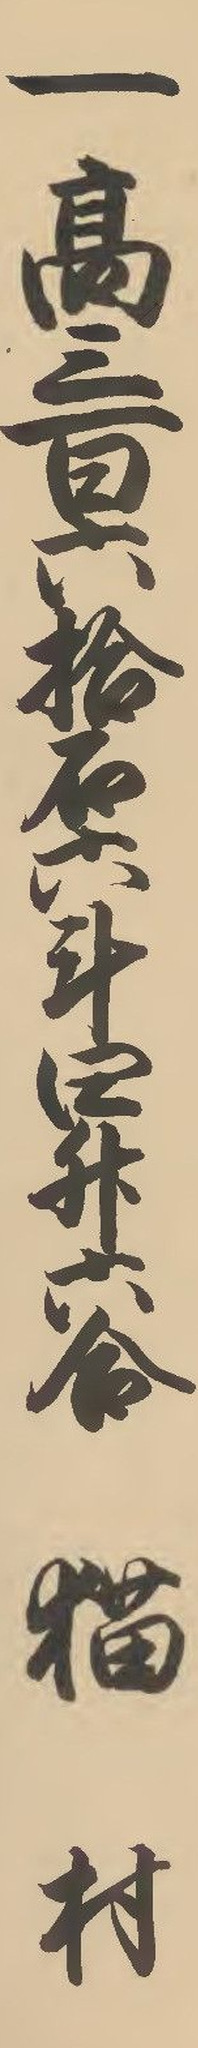一髙三百六拾石六斗四升六合猫村
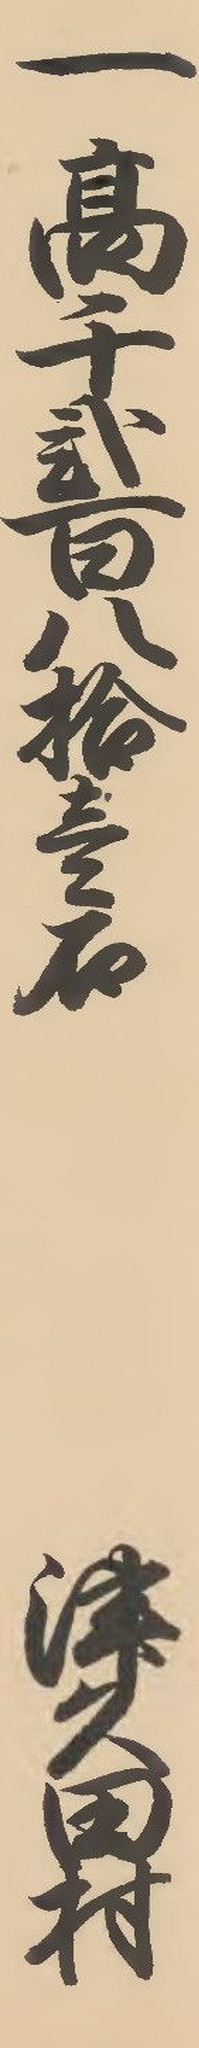一髙千弐百八拾壱石津久田村
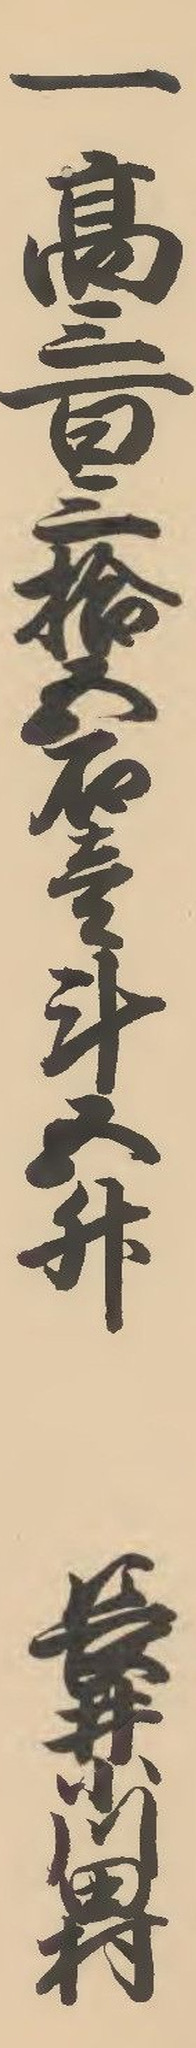一髙三百三拾五石壱斗五升長井小川田村
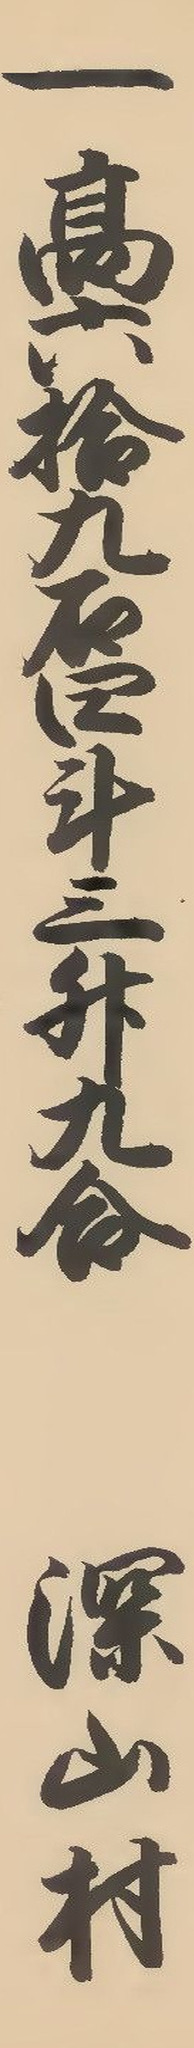一髙六拾九石四斗三升九合深山村
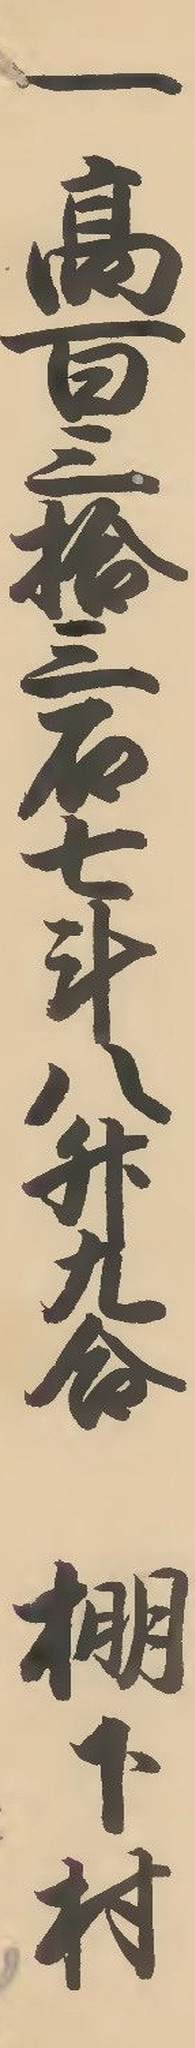一髙百三拾三石七斗八升九合棚下村
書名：上野国郷帳
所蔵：国立公文書館 National Archives of Japan
